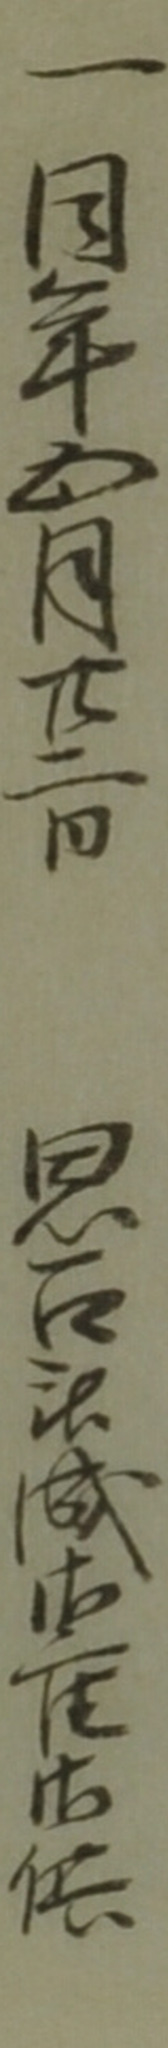一同年五月廿二日思召被成御座御供
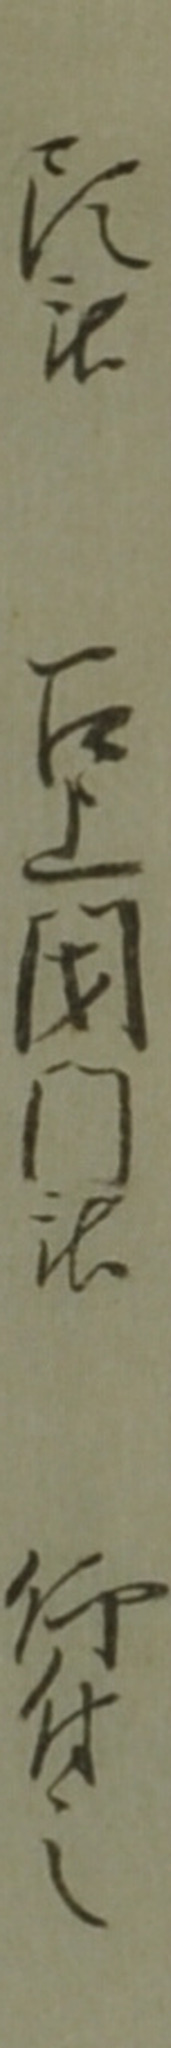頭被召上閉門被仰付之
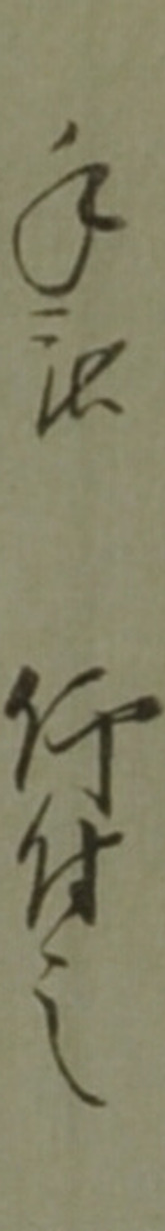手被仰付之
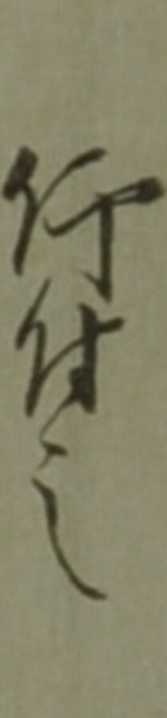仰付之
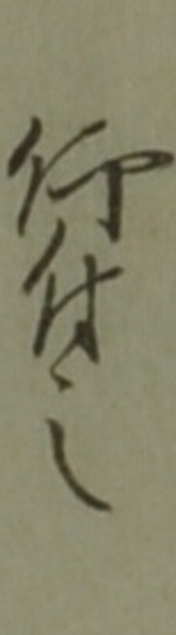仰付之
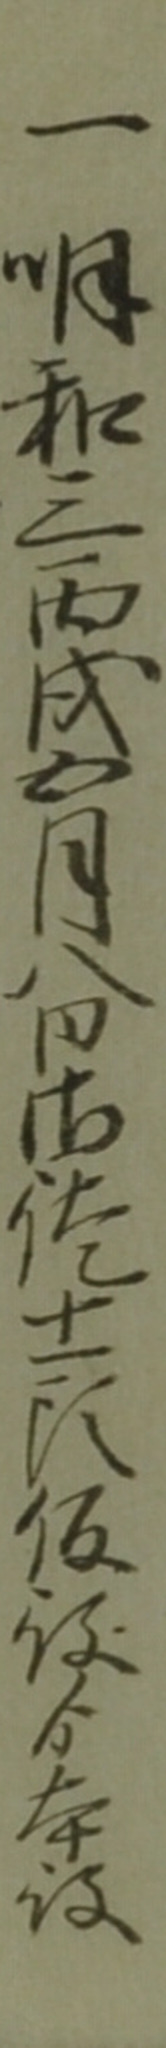一明和三丙戌五月八日御徒士頭仮役ゟ本役
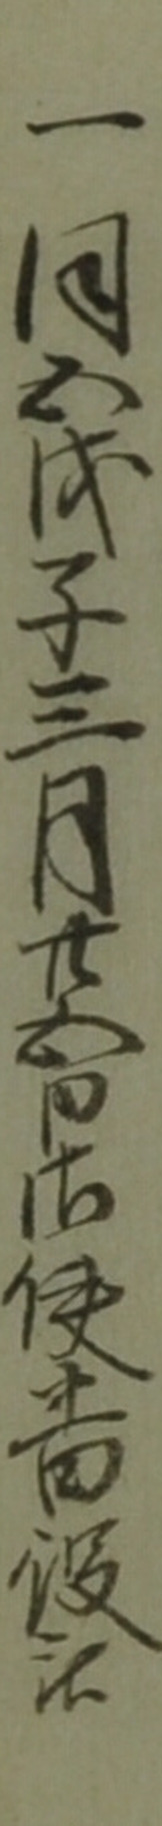一同五戊子三月廿五日御使番役被
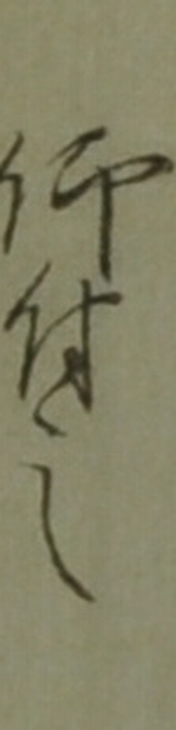仰付之
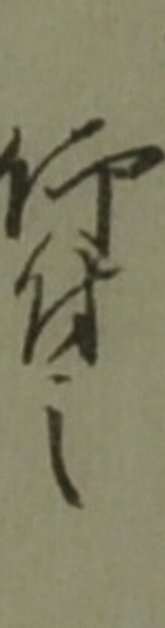仰付之
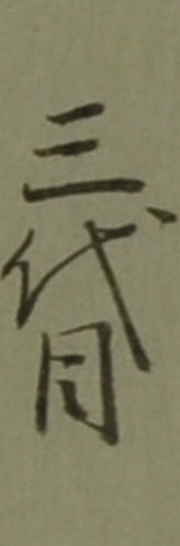三代目
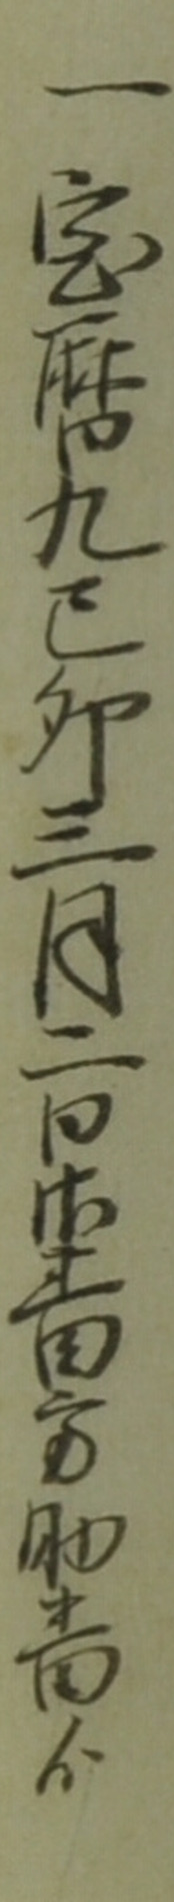一宝暦九己卯三月二日御番方助番ゟ
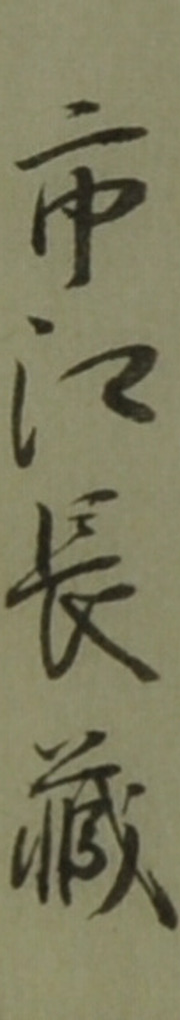市江長蔵

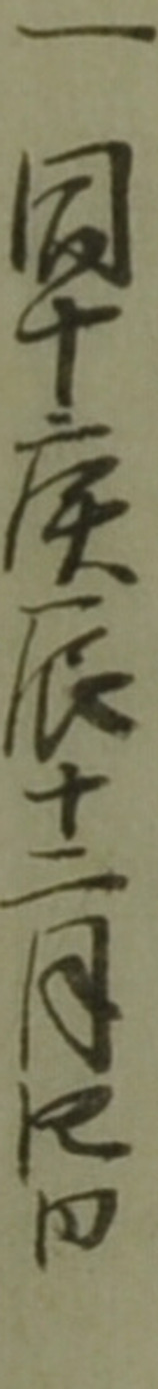一同十庚辰十二月四日
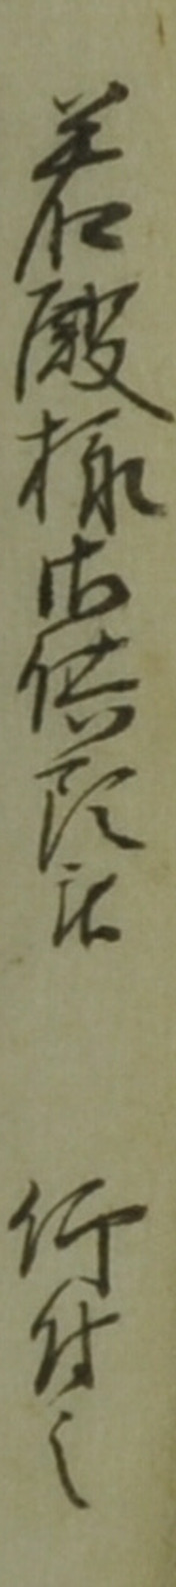若殿様御供頭被仰付之
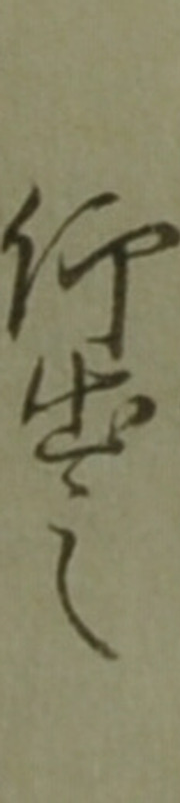仰出之
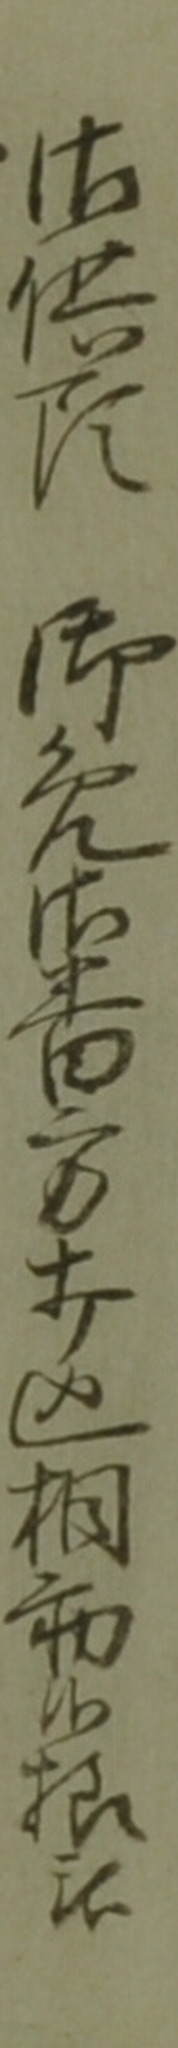御供頭御免御番方打込相勤候様被
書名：諸御役代々録（六）
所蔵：伊那市立高遠町図書館・合同会社AMANE
